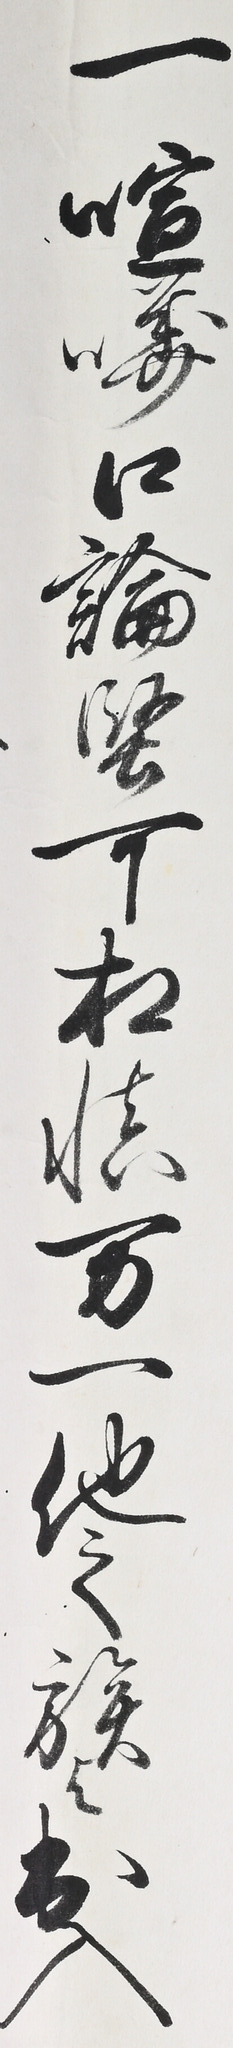一喧嘩口論堅可相慎万一外之族と出入
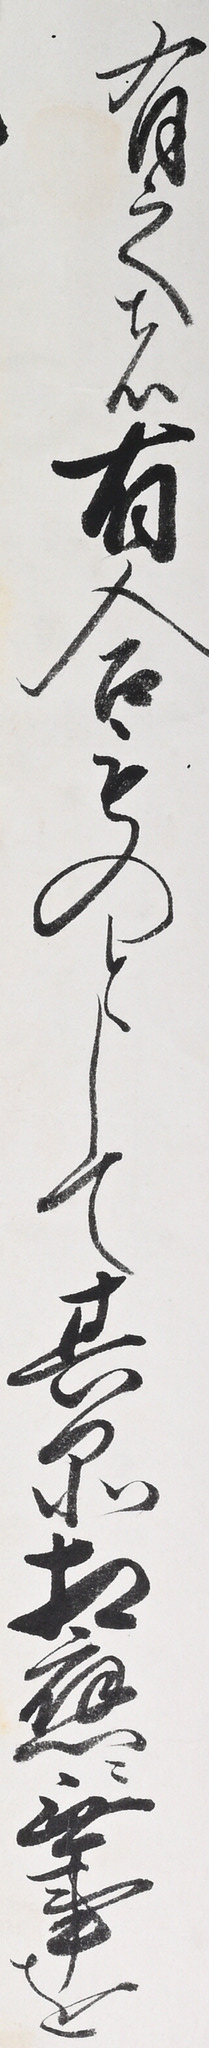有之者有合ものとして其品相応ニ無事を
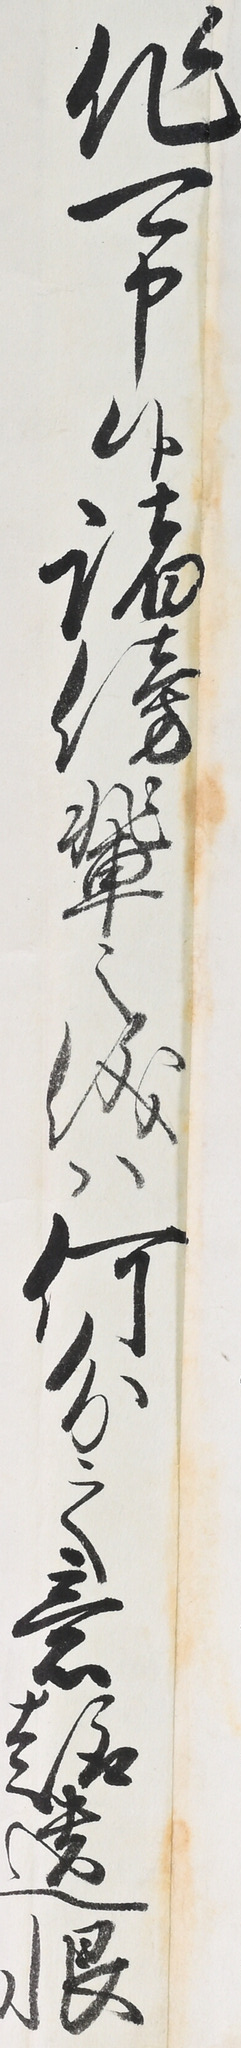作可申候諸傍輩之儀ハ何分之意趣遺恨
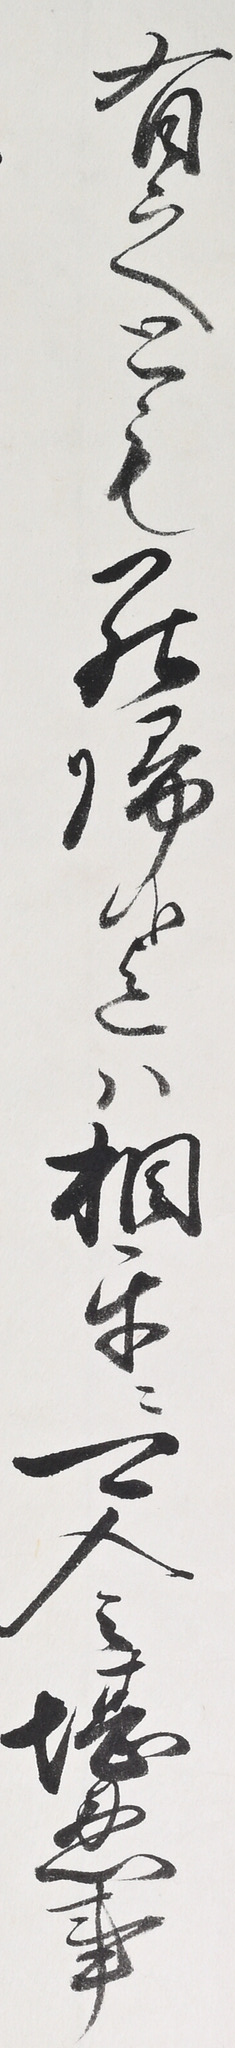有之とも罷帰候迄ハ相互ニ可令堪忍事
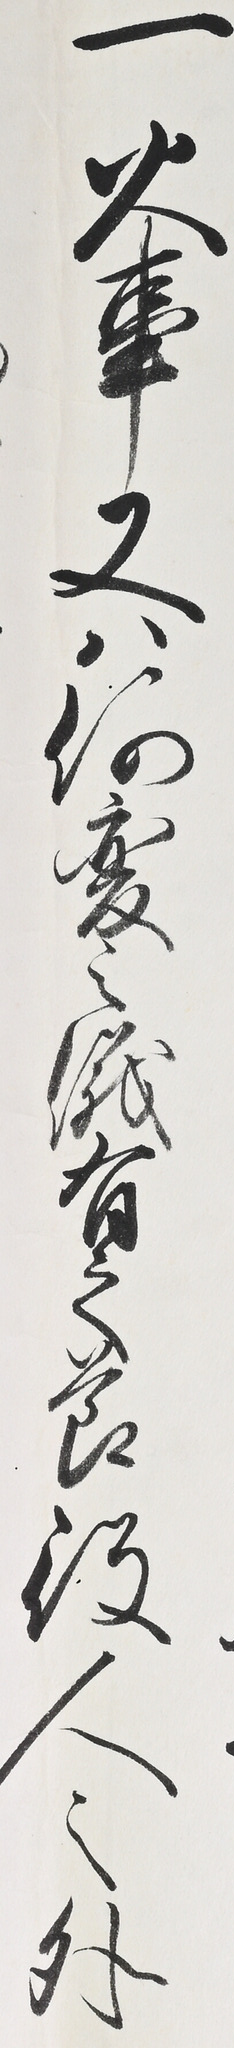一火事又ハ何変之儀有之節役人之外
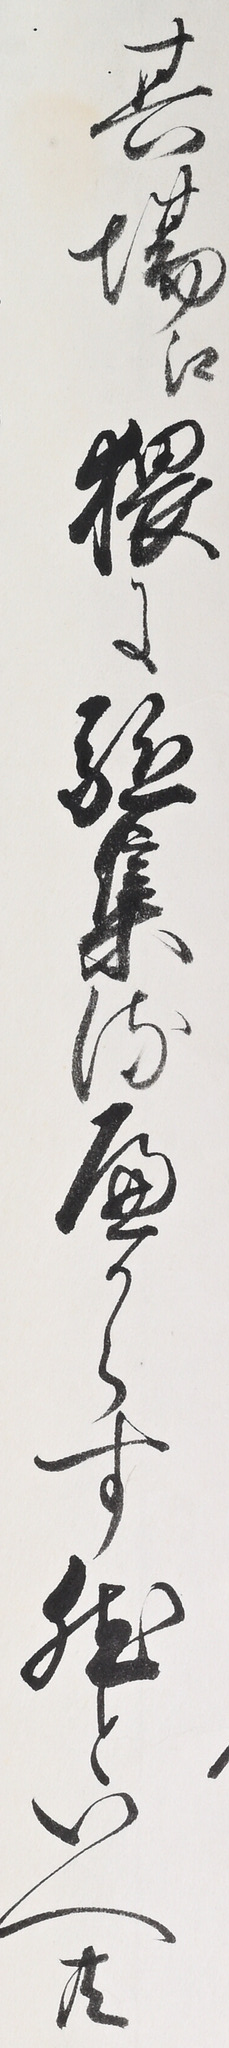其場え猥に駈集るへからす然といへ共
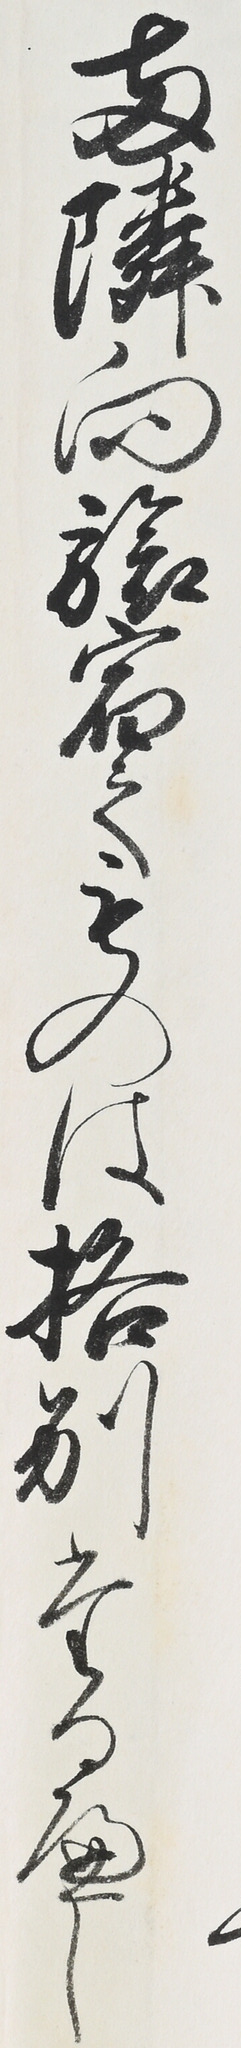両隣向旅宿之ものはか格別たるへし
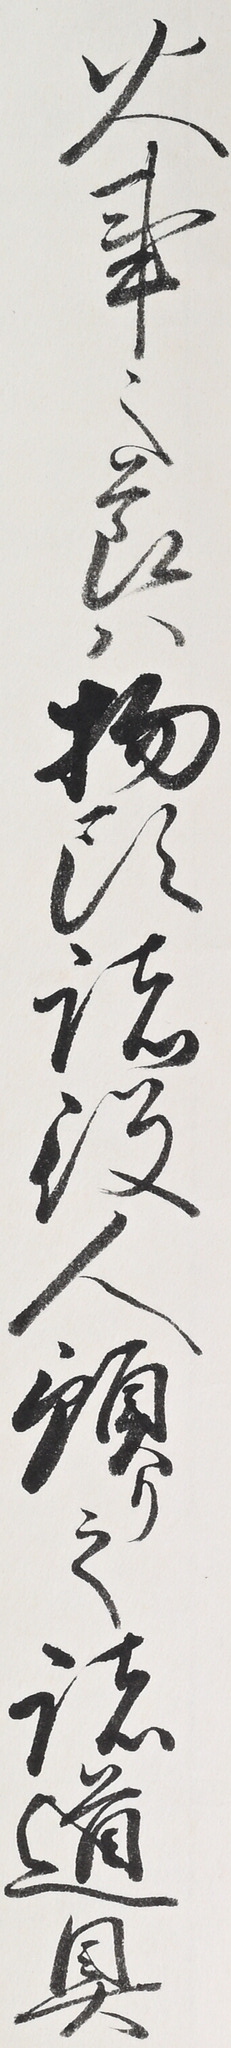火事之節ハ物頭諸役人預り之諸道具
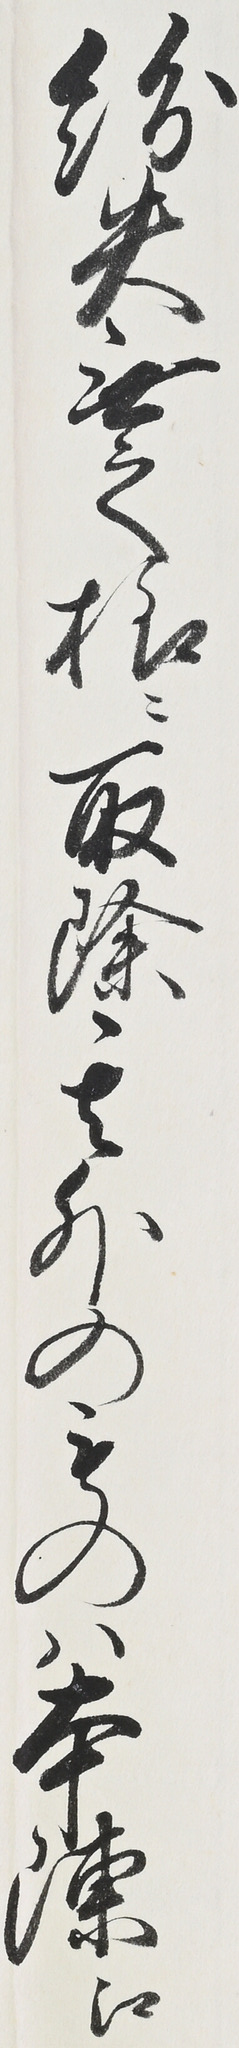紛失無之様ニ取除其外のものハ本陳え
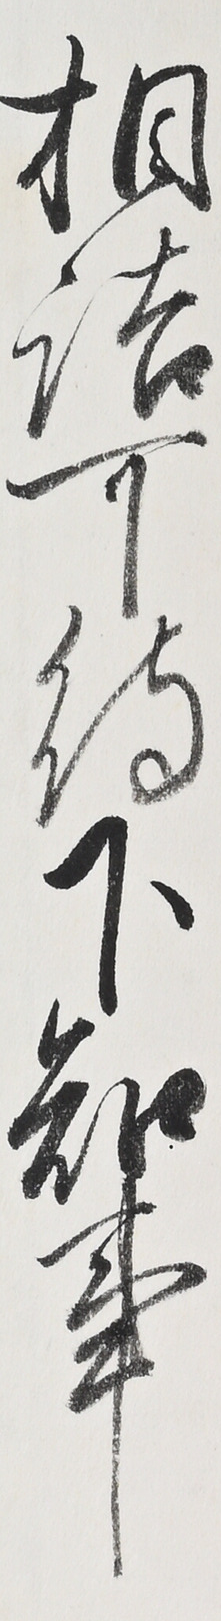相詰可待下知事
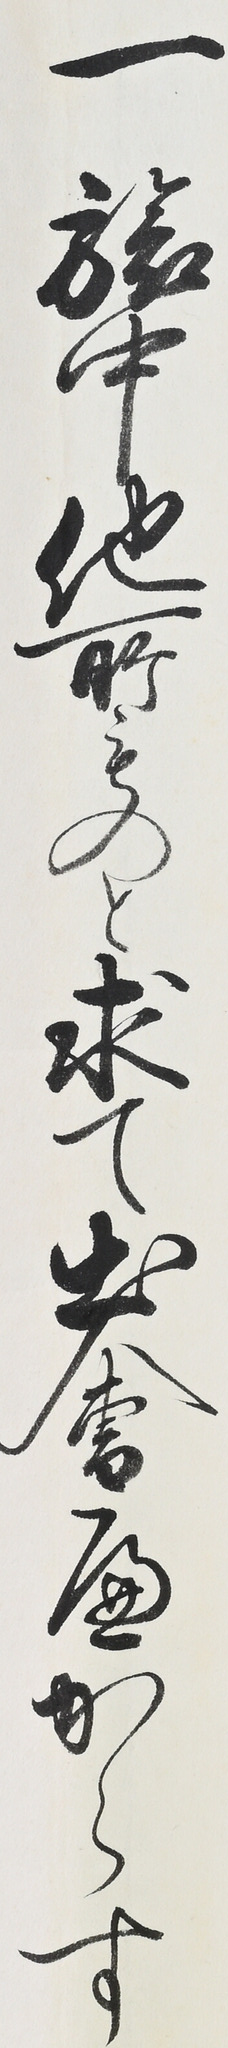一旅中他所ものと求て出会へからす
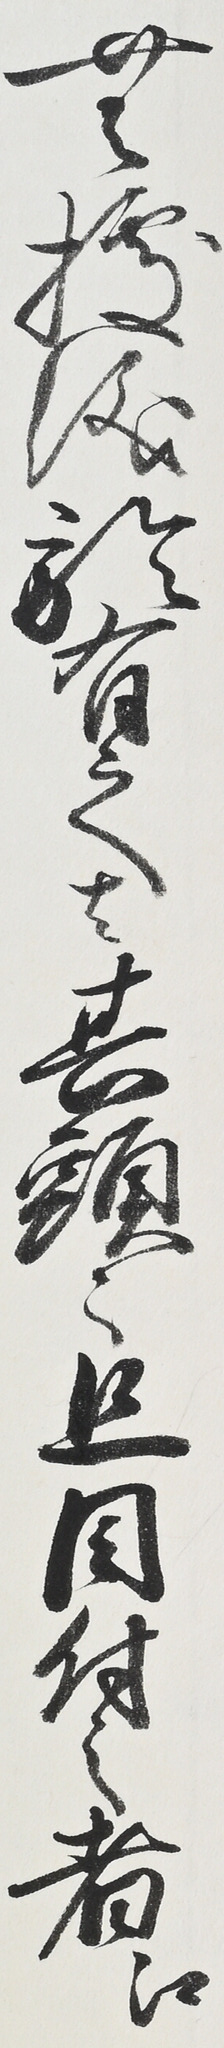無拠儀於有之者其頭之且目付之者え
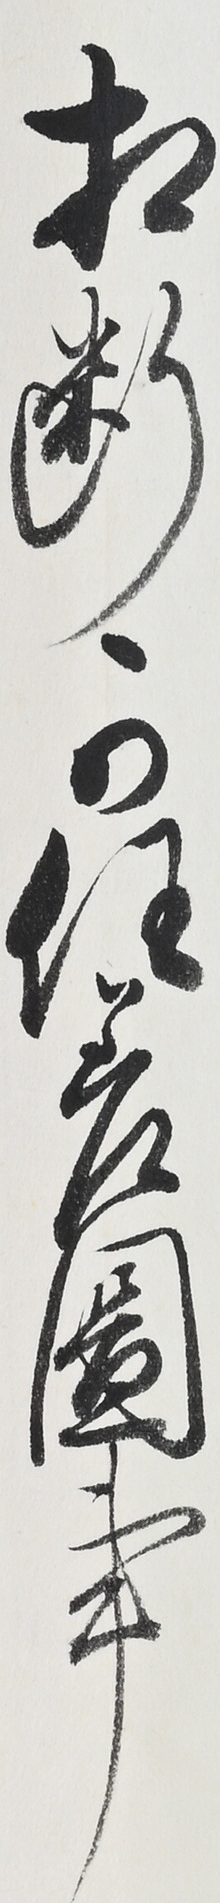相断可任差図事
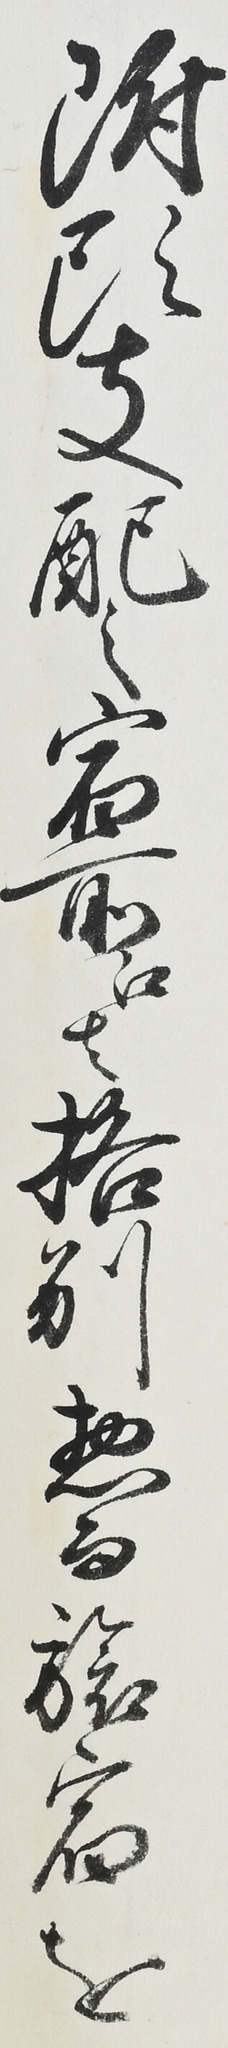附頭支配之宿所え者格別惣而旅宿を

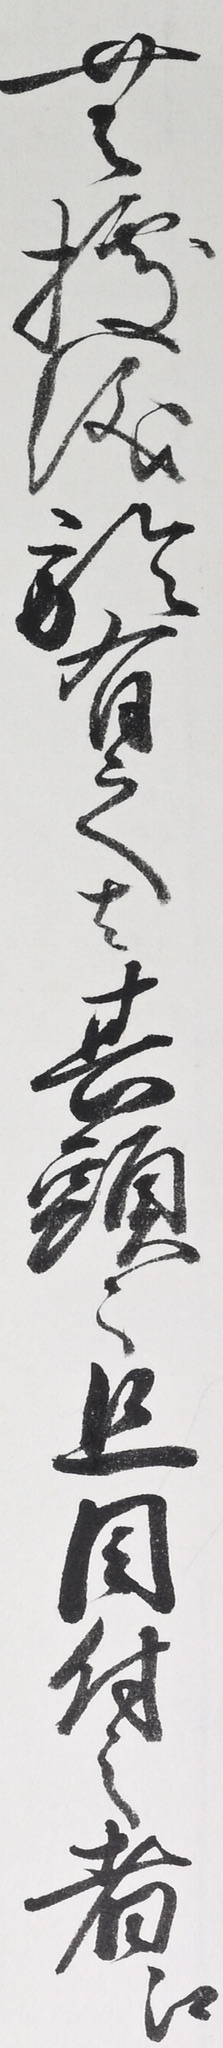無拠儀於有之者其頭之且目付之者え
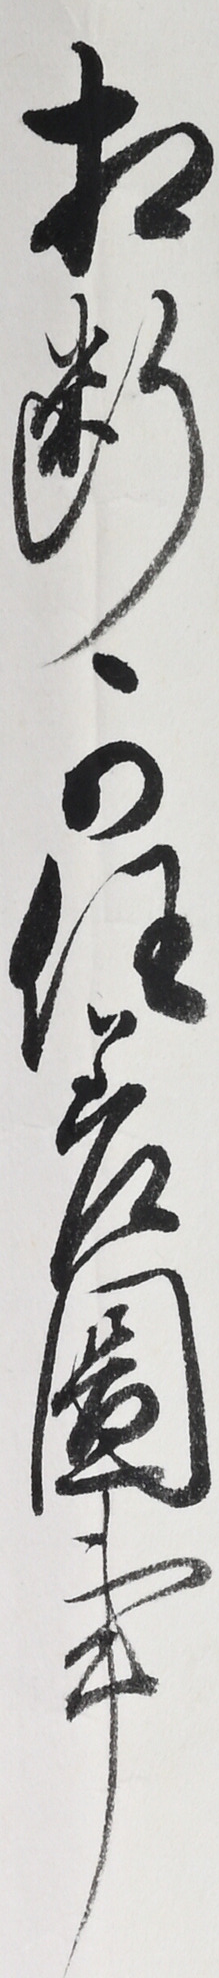相断可任差図事
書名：大阪道中法度
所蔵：伊那市立高遠町図書館・合同会社AMANE
